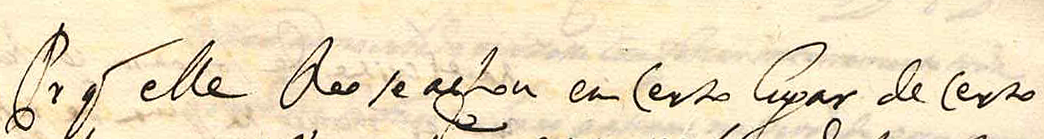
Pr q̄ elle Reo se achou em Certo lugar de certo
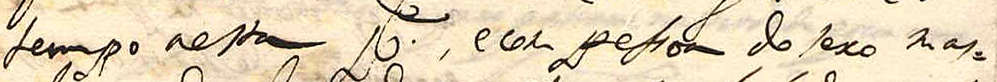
tempo a esta p.te, e com pessoa do sexo mas
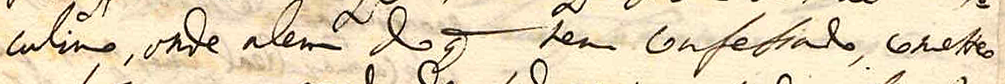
culino, onde alem do q̄ tem confessado, cometteo
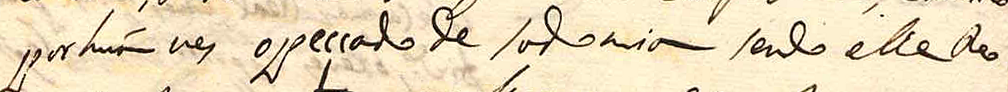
por huā ues o peccado de sodomia sendo elle Reo
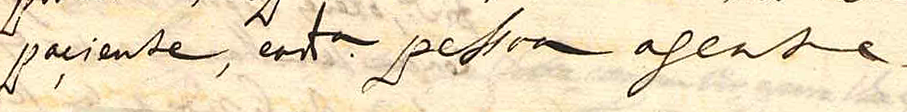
paçiente, e a d̄.a pessoa agente
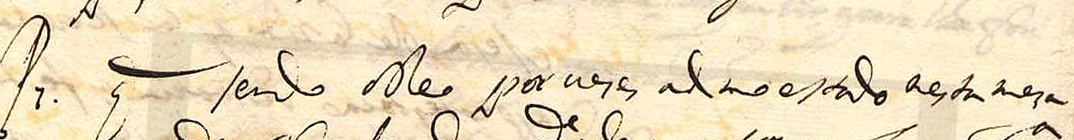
Pr. q̄ sendo o Reo por uezes admoestado nesta meza
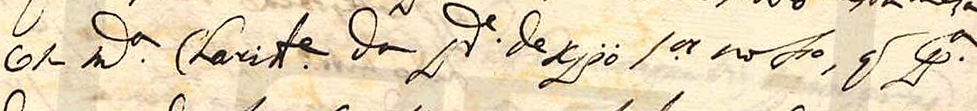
com m.ta Charid.e da p.te de xp̄o s.or nosso, q̄ p.a
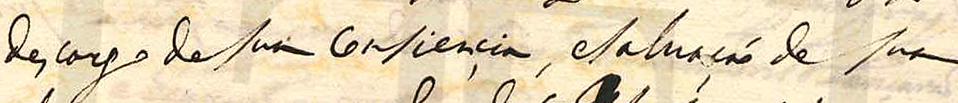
descargo de sua consiençia, e saluaçaõ de sua
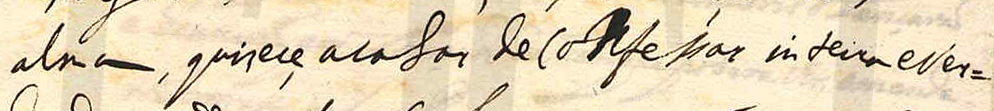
alma, quizeçe acabar de confessar inteira e ver
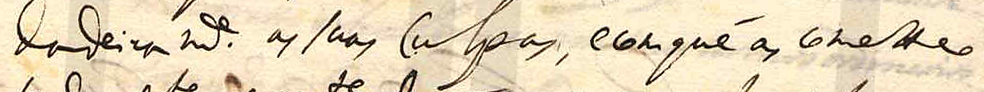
dadeiram.te as suas Culpas, e com quē as cometteo
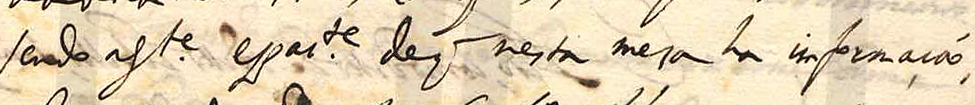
sendo ag.te e pac.te de q̄ nesta meza ha informaçaõ
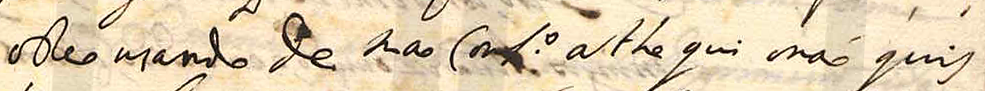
o Reo uzando de mao Cons.o athe qui o naõ quis
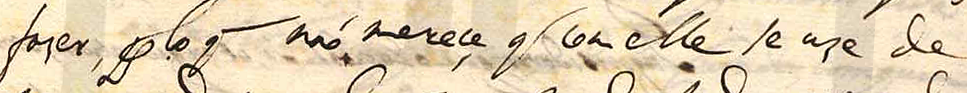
fazer, plo q̄ naõ mereçe q̄ com elle se uze de
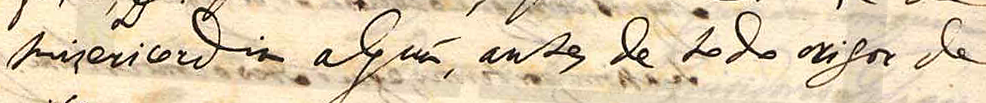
mizericordia alguā, antes de todo o rigor de
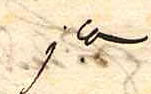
j.ca
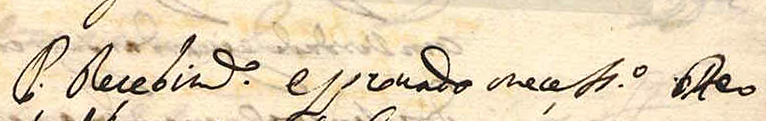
P. Recebimdo e prouado o necess.o o Reo
